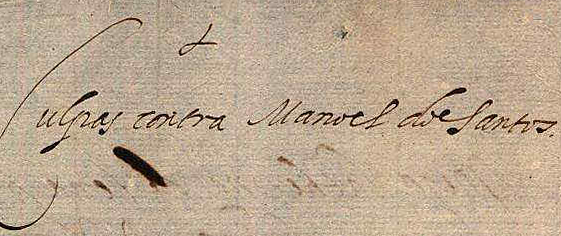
Culpas contra Manoel dos Santos
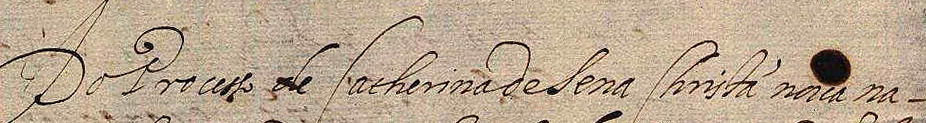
Do Processo de Catherina de Sena Chista̅ noua na
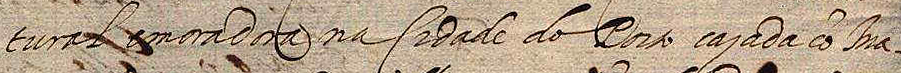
tural e moradora na Cidade do Porto cazada co̅ Ina
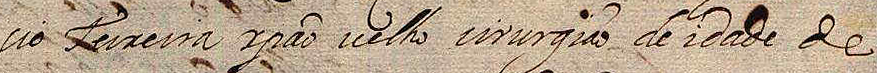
cio Teixeira xpão uelho cirurgião de idade de
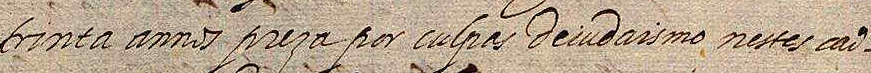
trinta annos preza por culpa de iudaismo nestes car
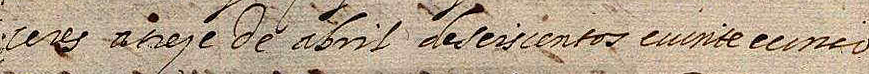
ceres a treze de abril de seiscentos e uinte e cinco
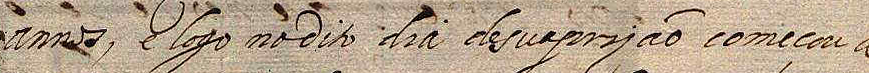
annos, e logo no dito dia de sua prizão começou a
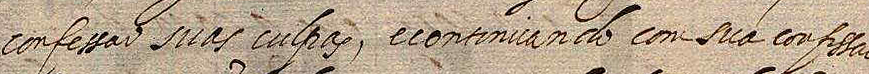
confessar suas culpas, e continuando com sua confissão
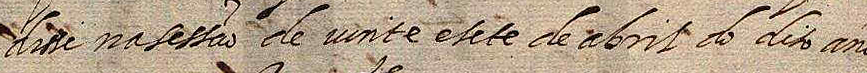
disse na sessão de uinte e sete de abril do dito ano
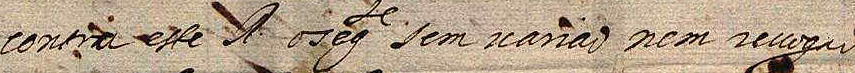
contra este R. o segte. sem uariar nem reuogar
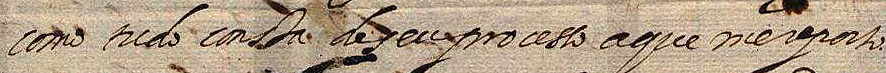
como tudo consta de seu processo a que me reporto
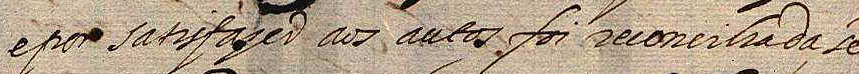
e por satisfazer aos autos foi reconciliada, se̅
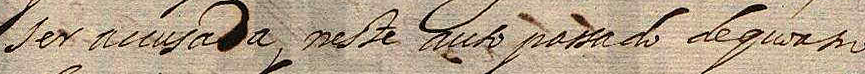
ser accusada, neste auto passado de quoatro
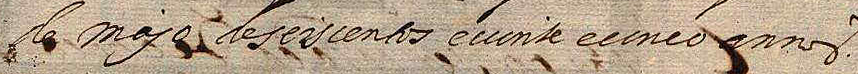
de majo de seiscentos e uinte e cinco annos.
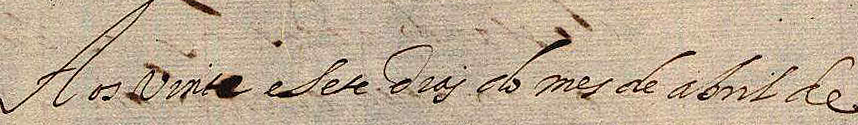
Aos vinte e sete dias do mes de abril de
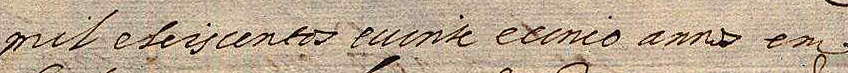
mil e seiscentos e uinte e cinco annos em
